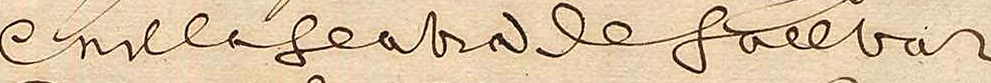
e nella se aviā de sallvar
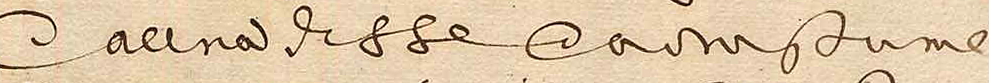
e all nā disse e ao costume
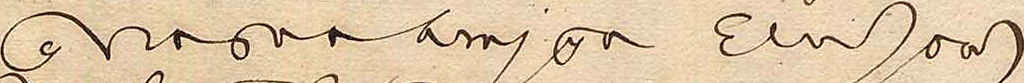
q̄ era sua amjga E eu Joā
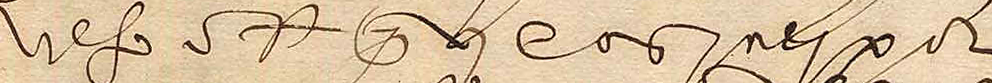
velho o stp̄vj e asjnej por
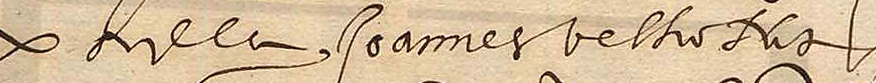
por ella Joannes Velho Notr
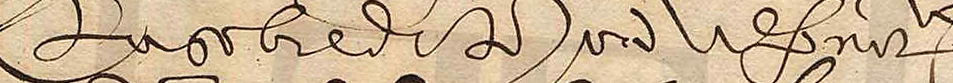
Eu sobredito Joā velho notro
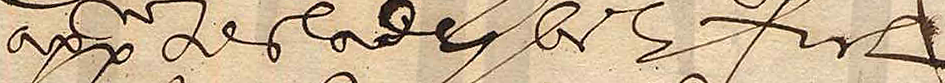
appco tresladej bē E fieL
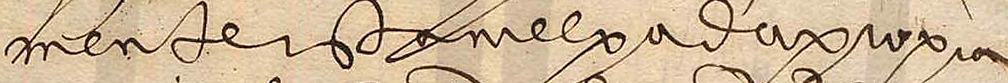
mente esta cullpa da propia
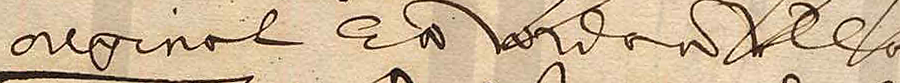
original E cōcorda cō ella
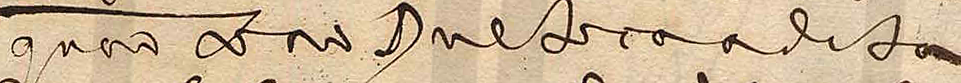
quaōto ao que toca a dita
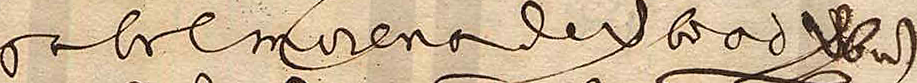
Jsabel morena de ꝟbo ad ꝟbū
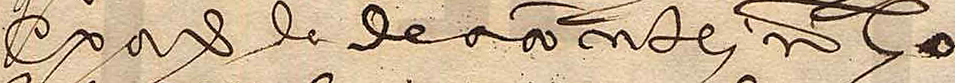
e ꝑa ꝟdade a cōcertej cō ho
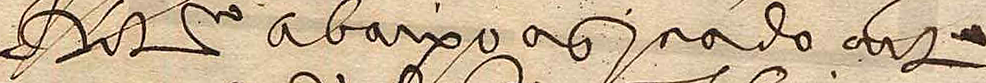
Notro abaixo asjnado outo
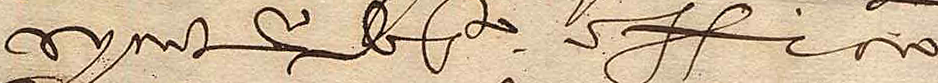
sy notro do sto. offiçio
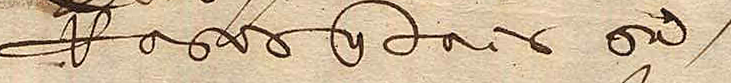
Rasos q̄ taes sā/
